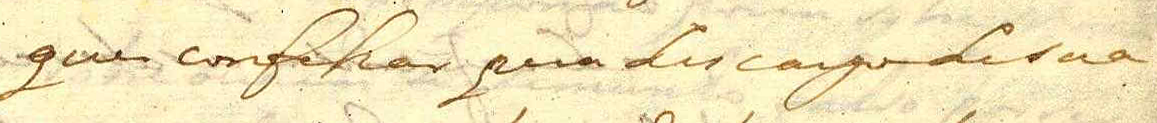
quer confessar pera descargo de sua
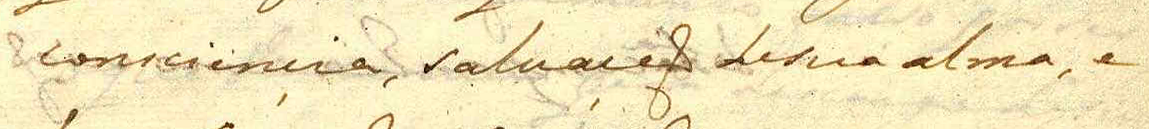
consciencia, saluaçaõ de sua alma, e
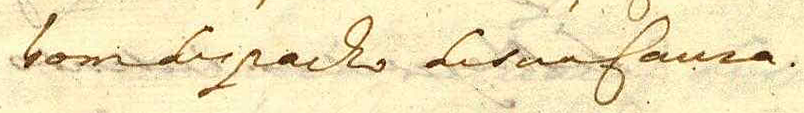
bom despacho de sua Cauza.
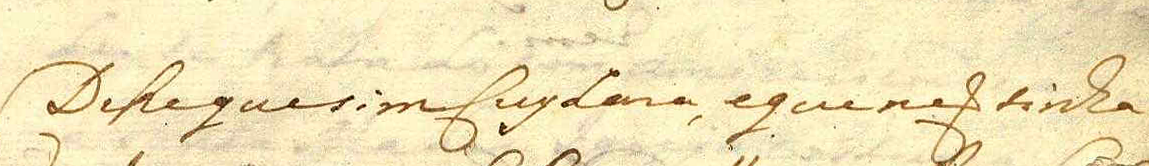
Disse que sim Cuydara, e que naõ tinha
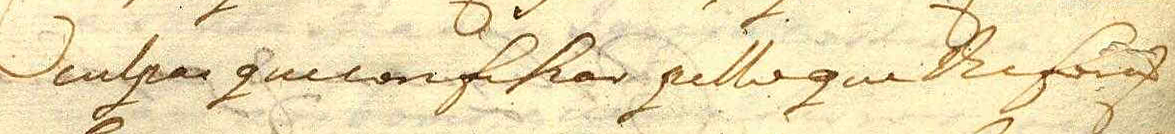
culpas que confessar pello que lhe foraõ
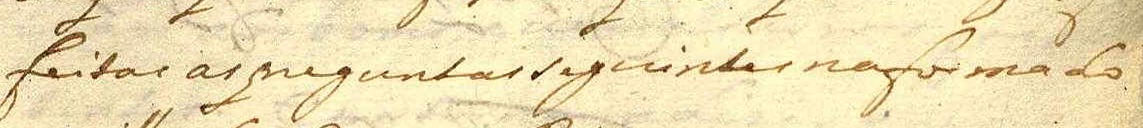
feitas as preguntas seguintes na forma do
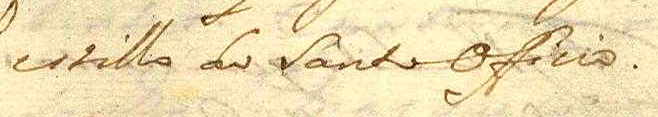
estillo do Santo Officio.
